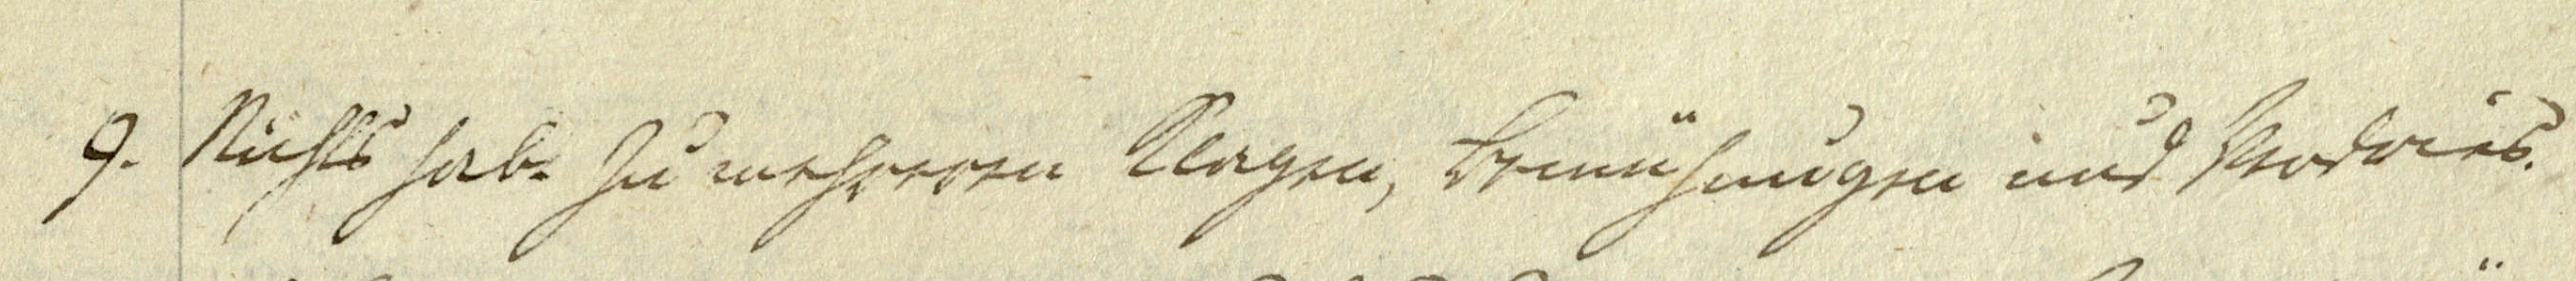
9. Nichts habe zu mehreren Klagen, Bemühungen und Verdries¬
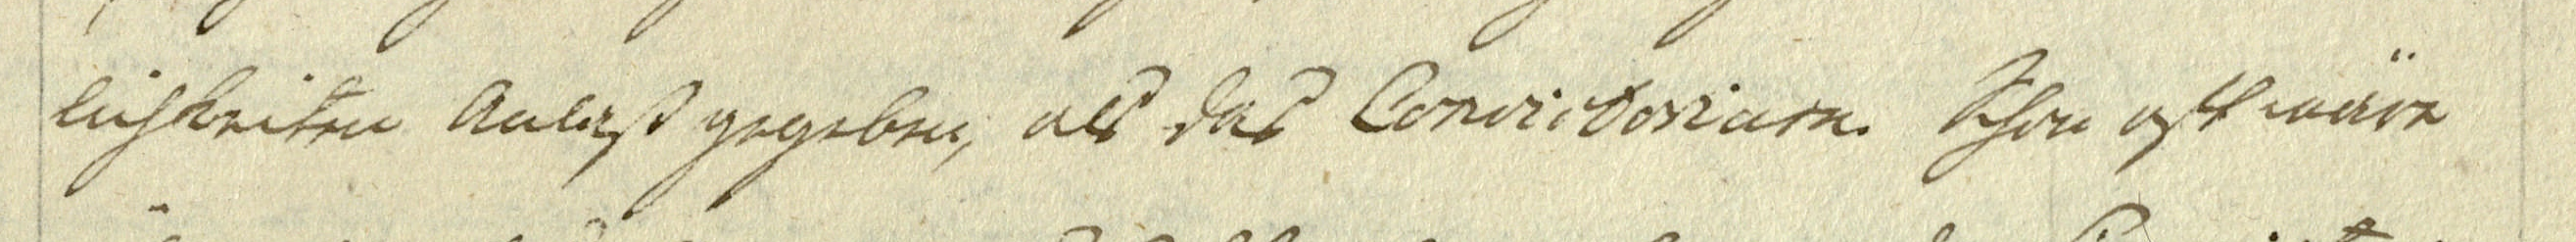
lichkeiten Anlaß gegeben, als das Convictorium. Schon oft wäre
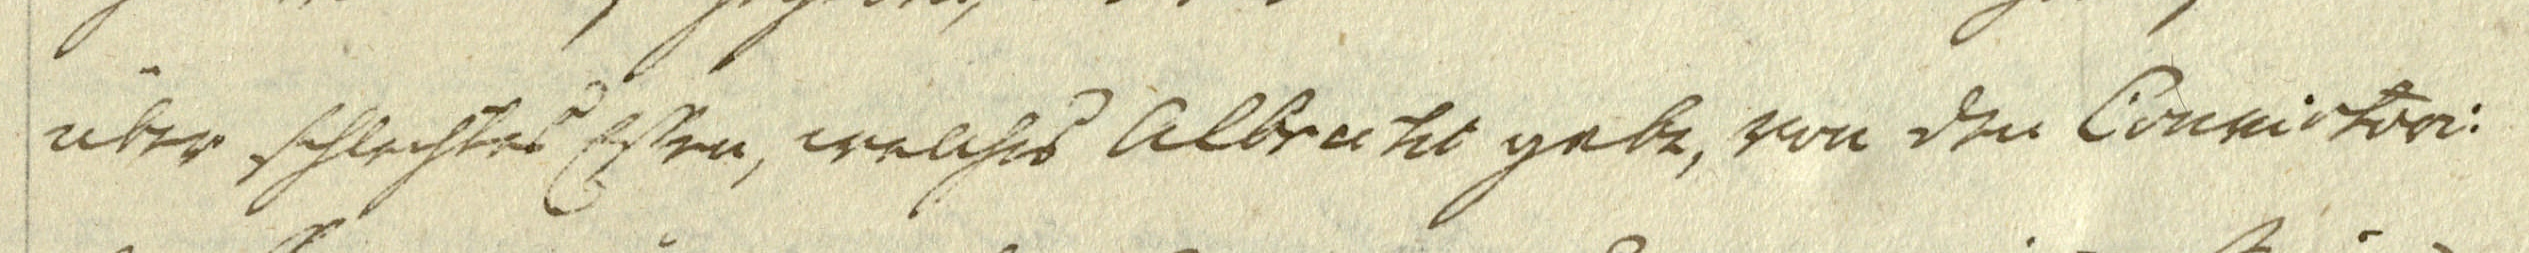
über schlechtes Essen, welches Albrecht gebe, von den Convictori¬
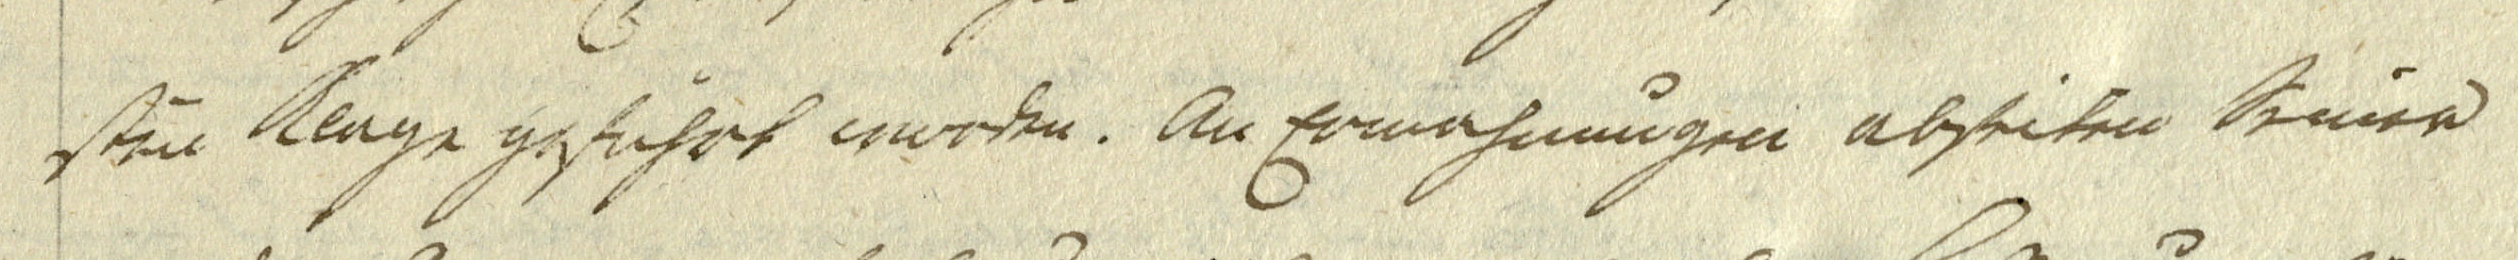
sten Klage geführt worden. An Ermahnungen abseiten Seiner
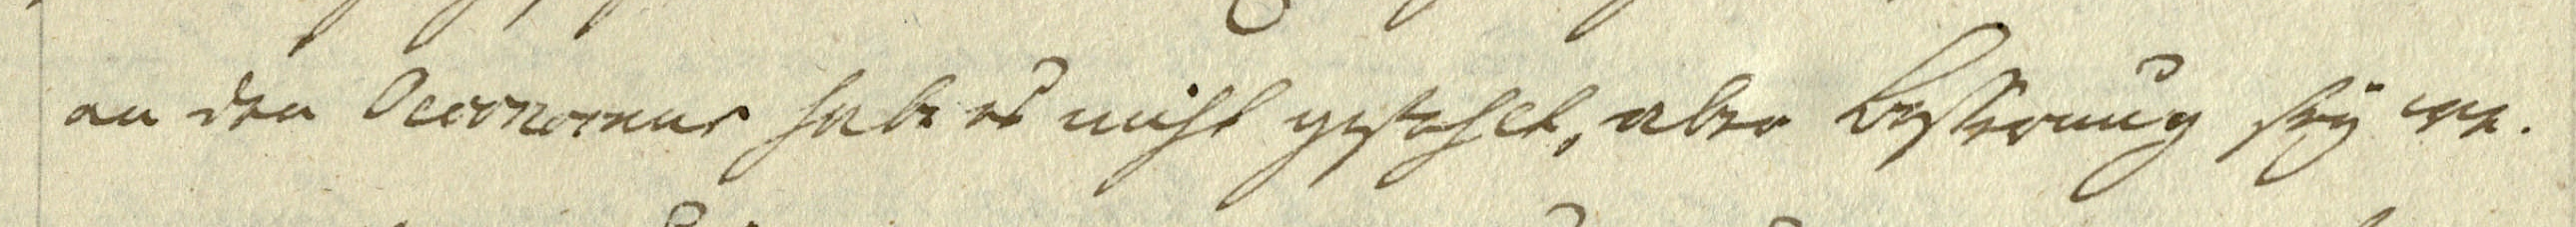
an den Oeconomus habe es nicht gefehlet, aber Besserung seÿ we¬
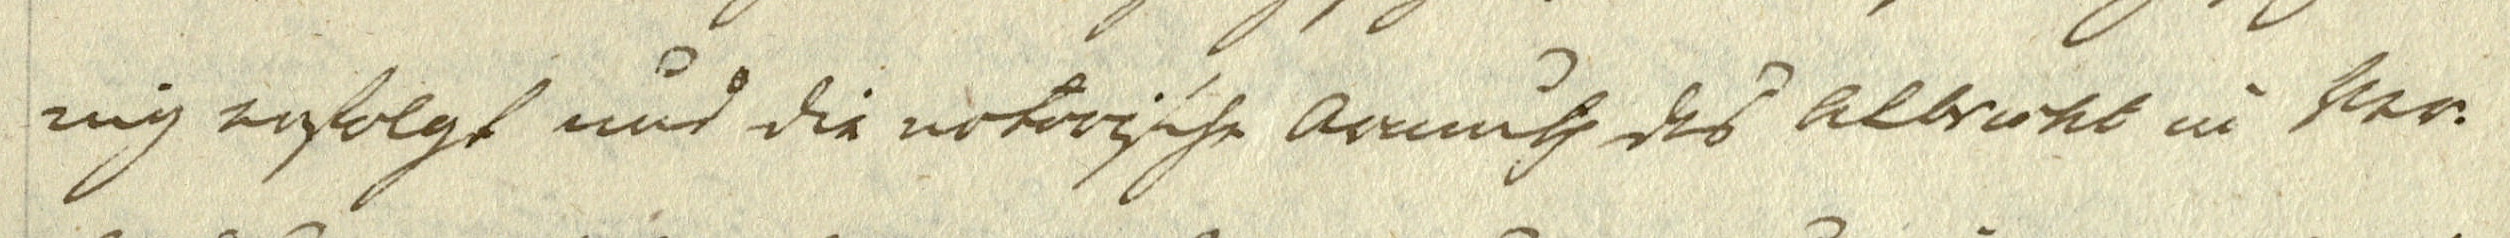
nig erfolgt und die notorische Armuth des Albrecht in Ver¬
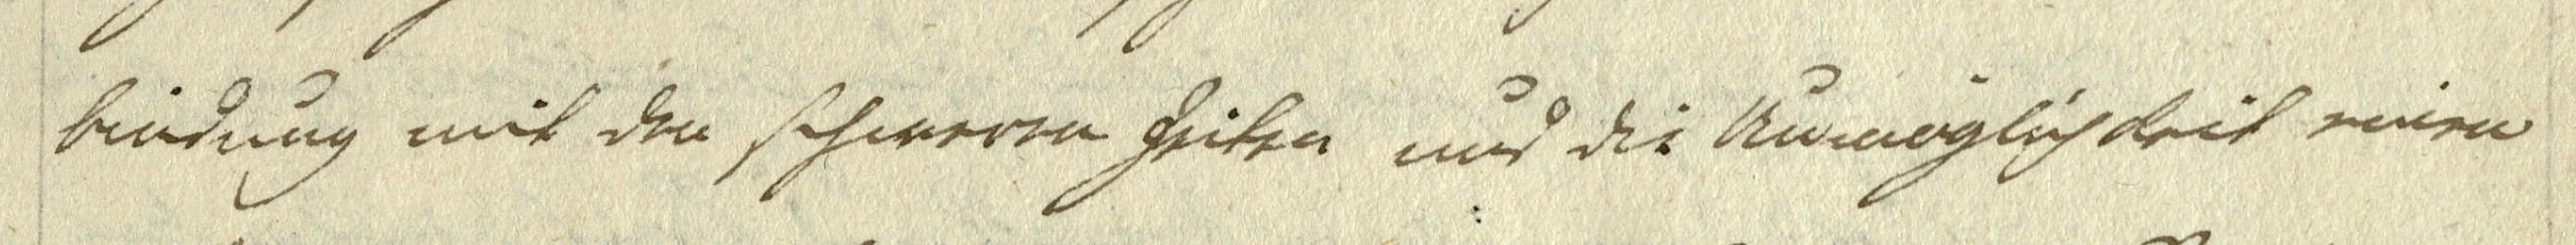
bindung mit den schweren Zeiten und die Unmöglichkeit, einen
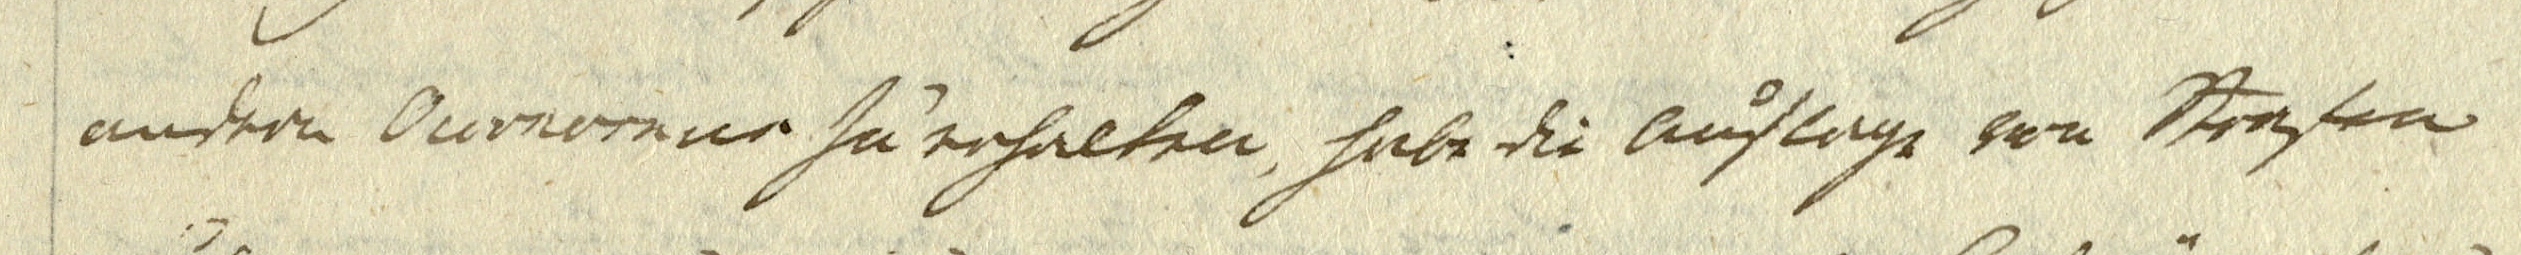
andern Oeconomus zu erhalten, habe die Auflage von Strafen
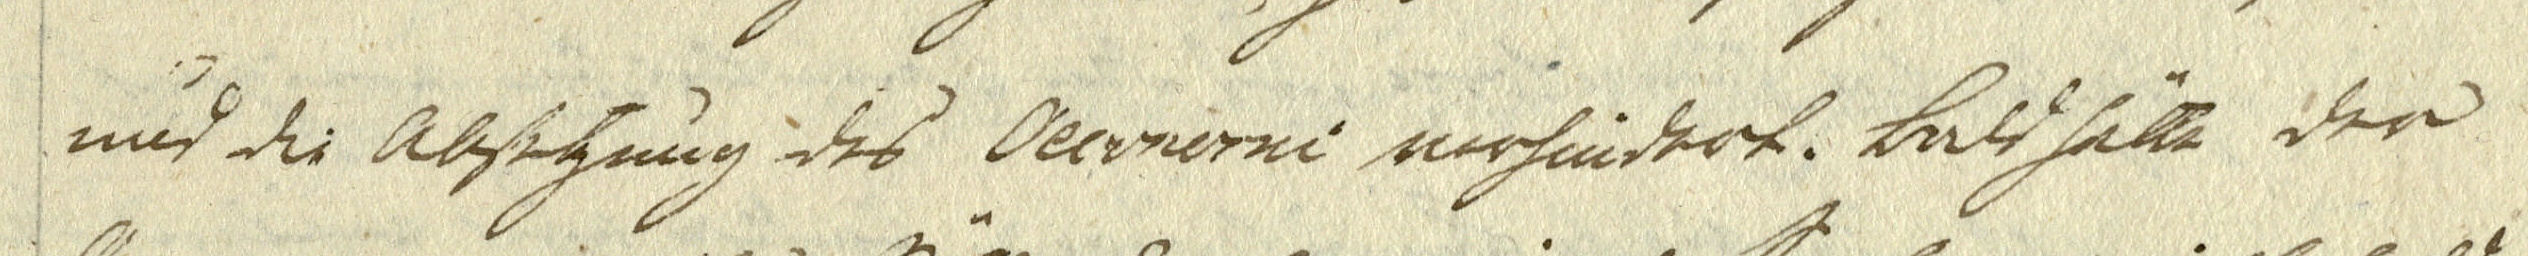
und die Absetzung des Oeconomi verhindert. Bald hätte der
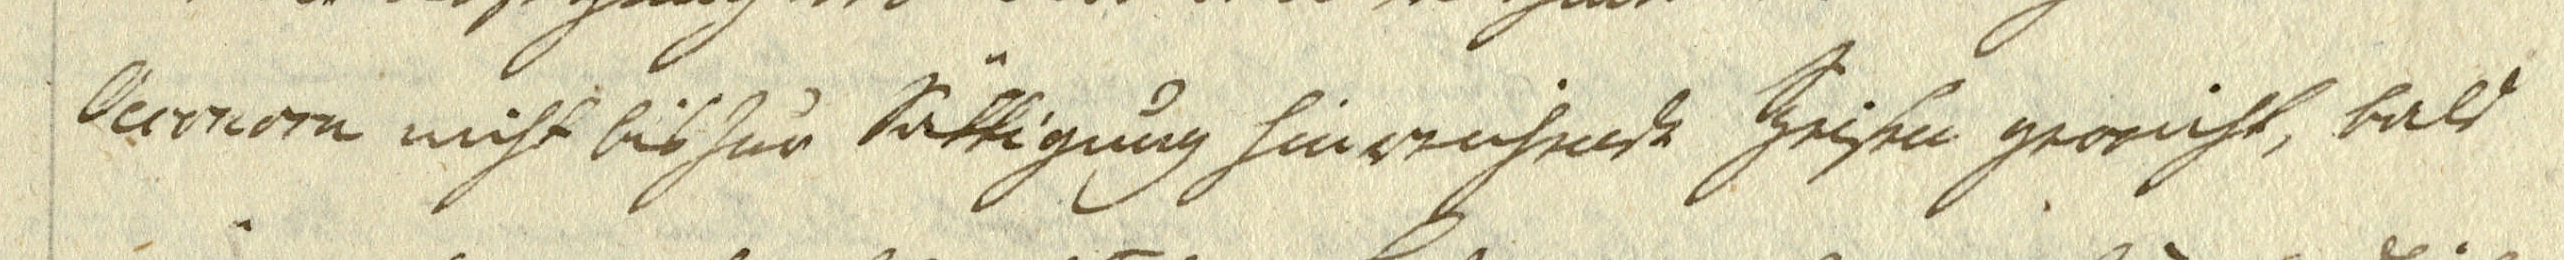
Oeconom nicht bis zur Sättigung hinreichende Speisen gereicht, bald
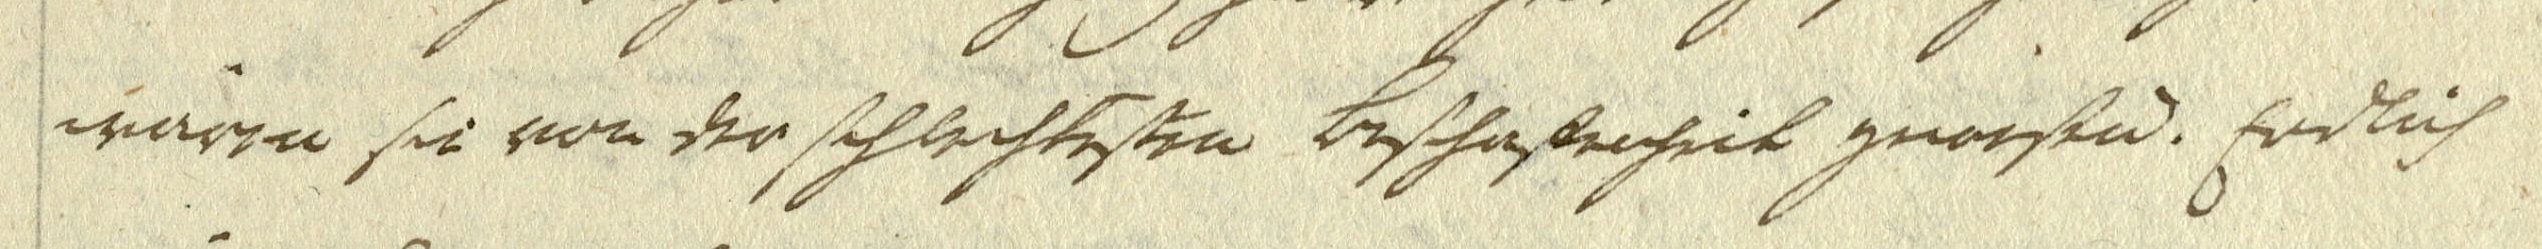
wären sie von der schlechtesten Beschaffenheit gewesen. Endlich
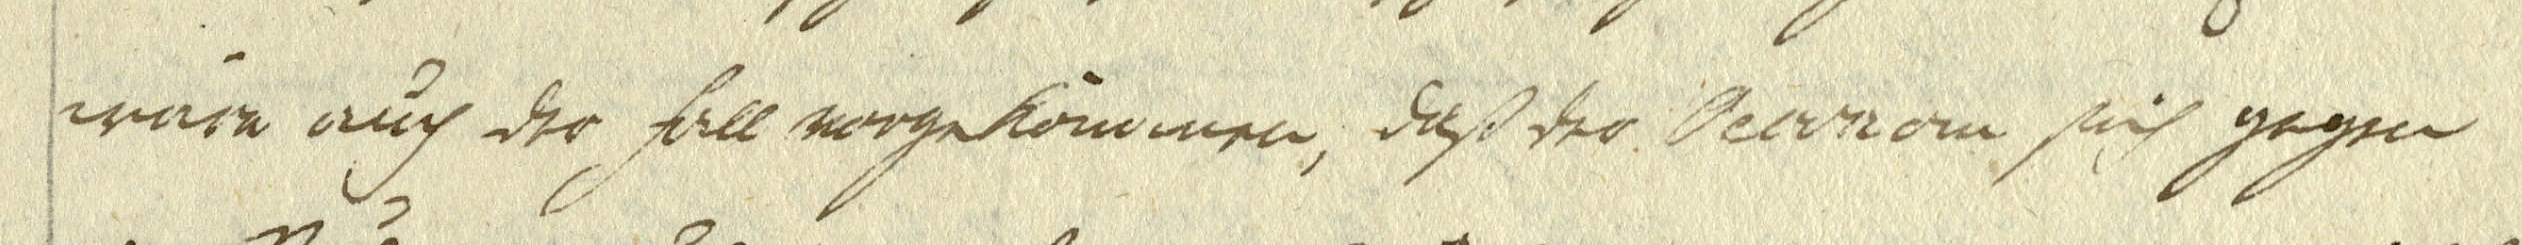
wäre auch der Fall vorgekommen, daß der Oeconom sich gegen
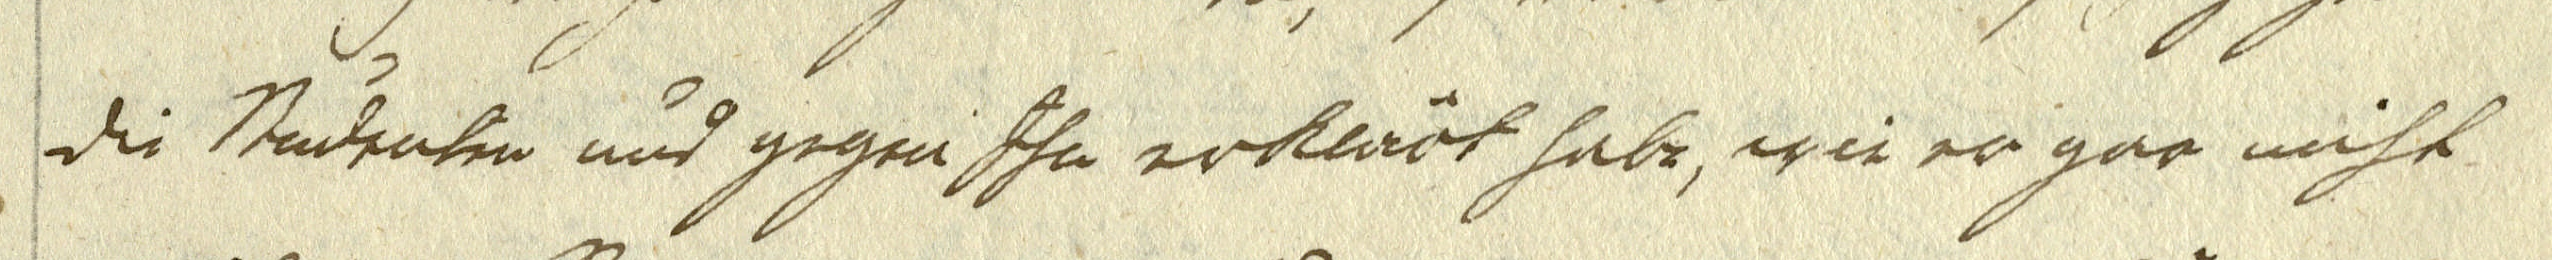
die Studenten und gegen Ihn erklärt habe, wie er gar nicht
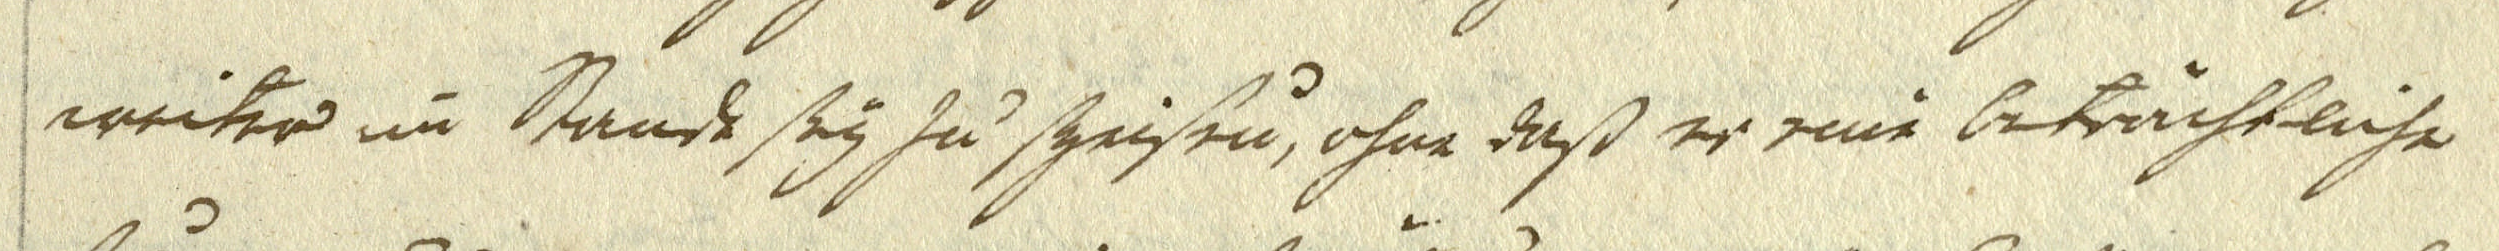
weiter im Stande seÿ zu speisen, ohne daß er eine beträchtliche
